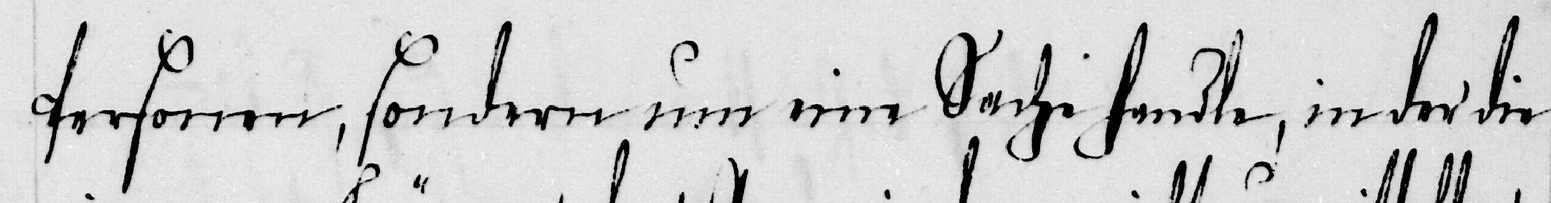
Personen, sondern um eine Sache handle, in der d¬
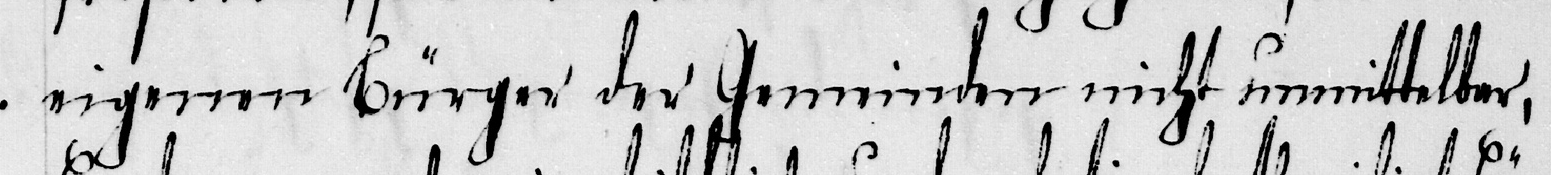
eigenen Bürger der Gemeinden nicht unmittelbar,
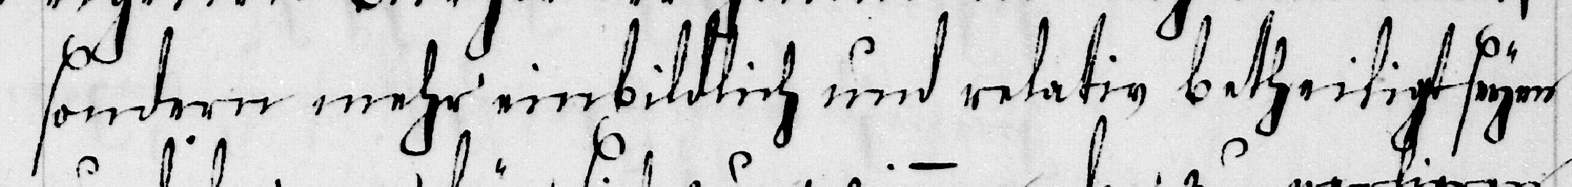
sondern mehr einbildlich und relativ betheiligt seyen
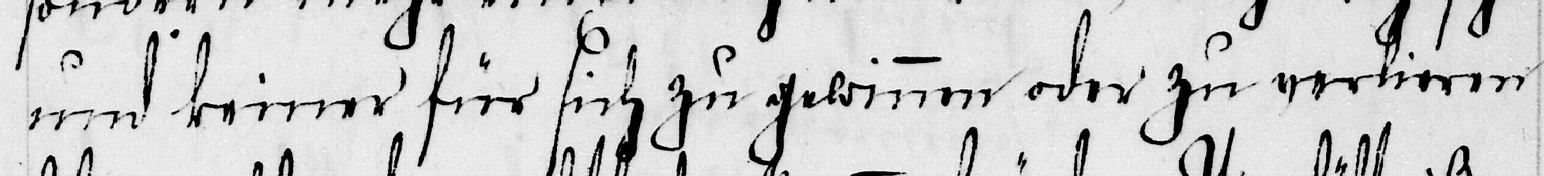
und keiner für sich zu gewinnen oder zu verlieren
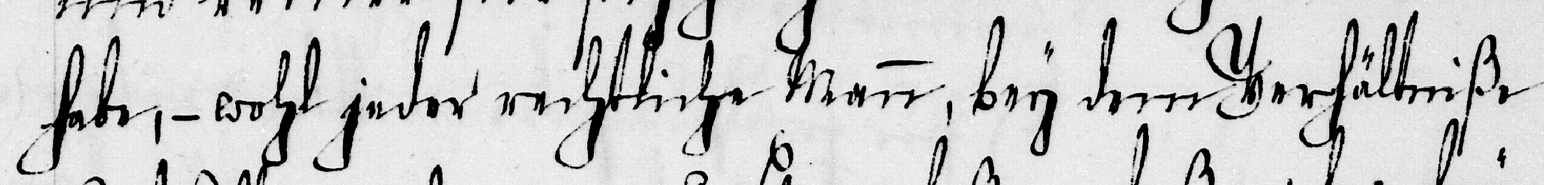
habe, – wohl jeder rechtliche Mann, bey dem Verhältniße
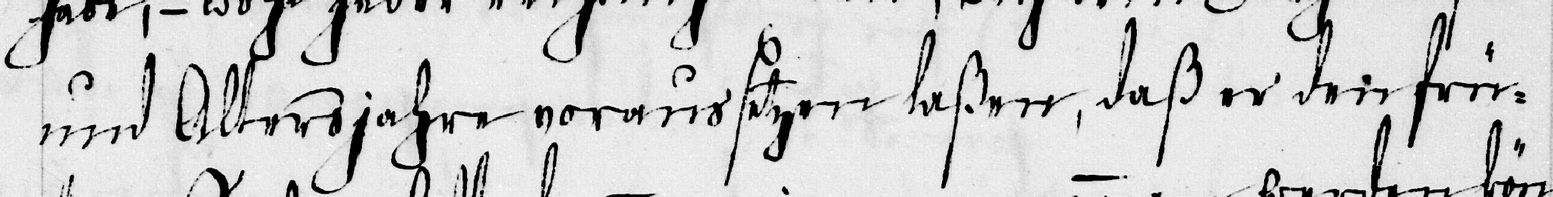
und Altersjahre voraussetzen laßen, daß er den frü¬
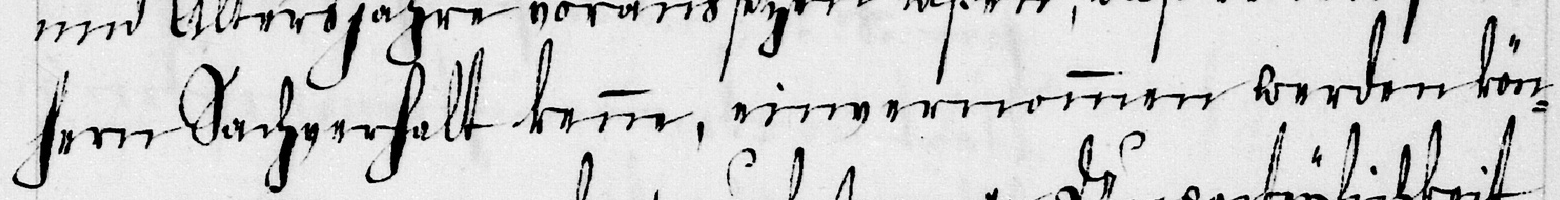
hern Sachverhalt kenne, einvernommen werden kön¬
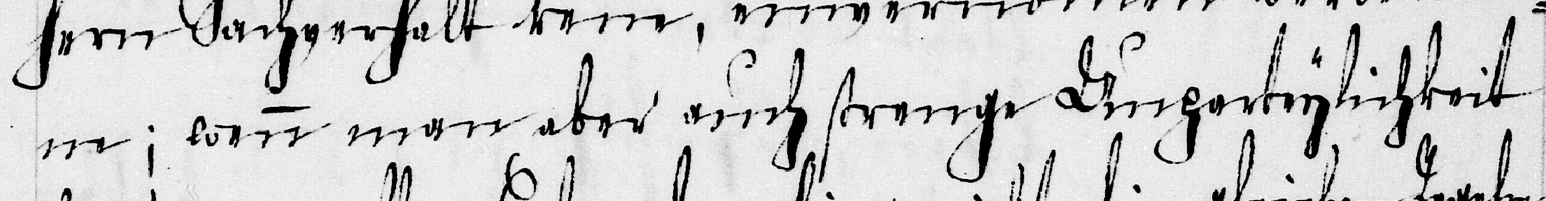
ne; wenn man aber auch strenge Unparteylichkeit
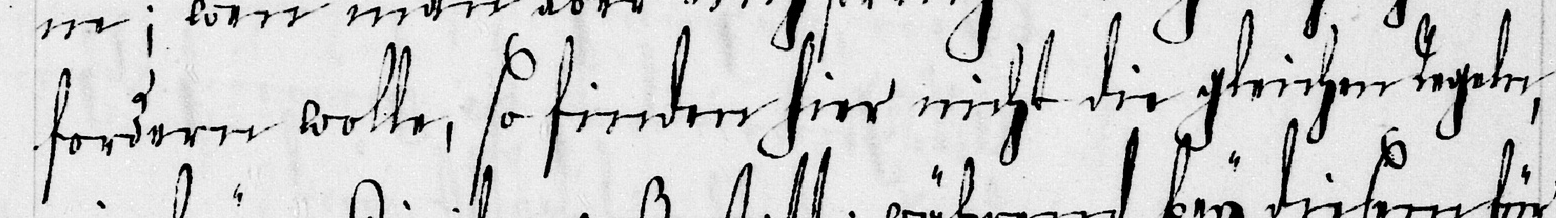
fordern wolle, so finden hier nicht die gleichen Regeln,
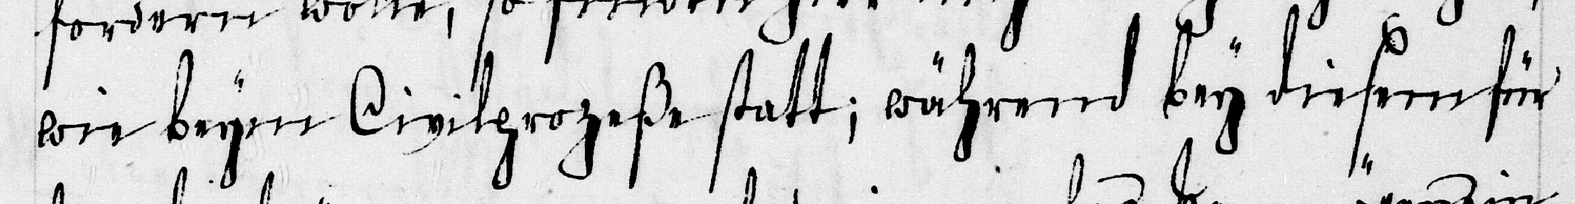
wie beym Civilprozeße statt; während bey diesem für
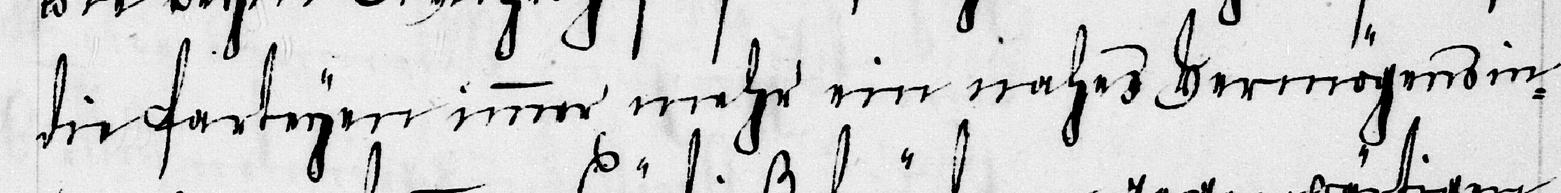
die Parteyen immer mehr ein nahes Vermögensin¬
